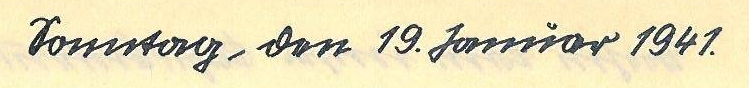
Sonntag, den 19. Januar 1941.
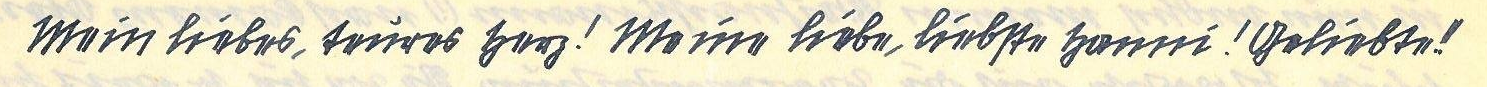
Mein liebes, teueres Herz! Meine liebe, liebste! Geliebte!!
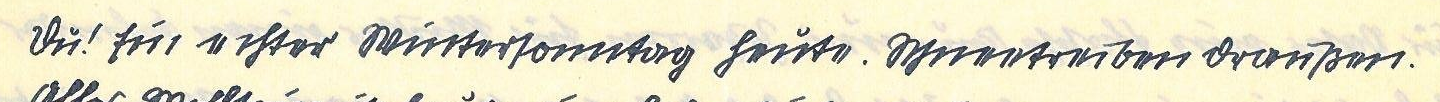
Du! Ein echter Wintersonntag heute. Schneetreiben draußen.
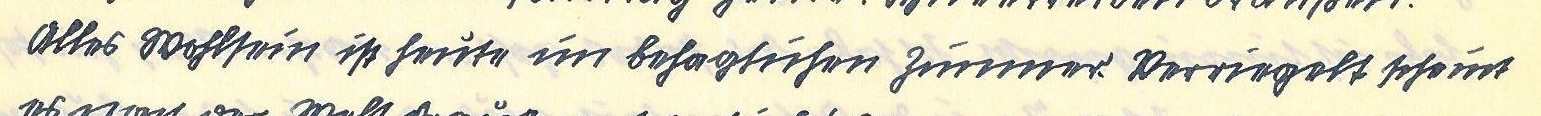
Alles Wohlsein ist heute im behaglichen Zimmer. Verriegelt scheint
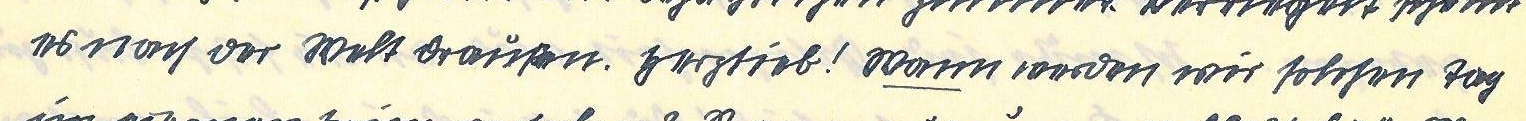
es nach der Welt draußen. Herzlieb! Wann werden wir solchen Tag
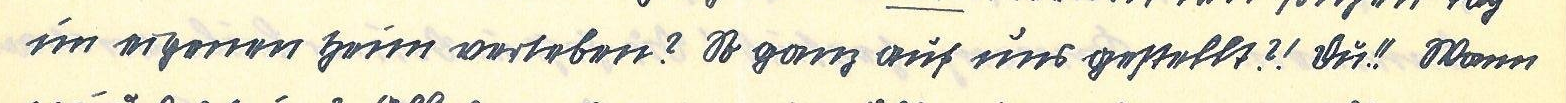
im eigenen Heim verleben? So ganz auf uns gestellt?! Du!! Wann
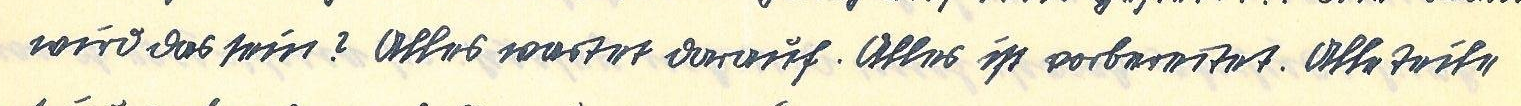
wird das sein? Alles wartet darauf. Alles ist vorbereitet. Alle Teile
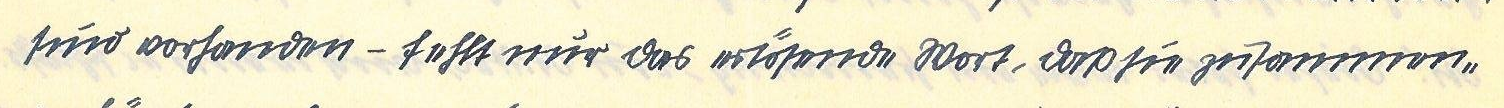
sind vorhanden – fehlt nur das erlösende Wort, daß sie zusammen¬
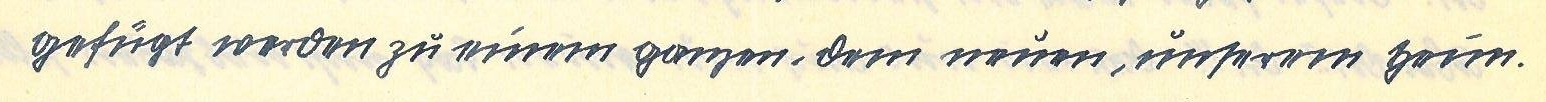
gefügt werden zu einem ganzen, dem neuen, unserem Heim.
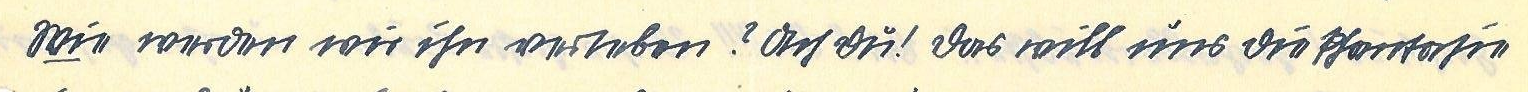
Wie werden wir ihn verleben? Ach Du! Das will uns die Phantasie
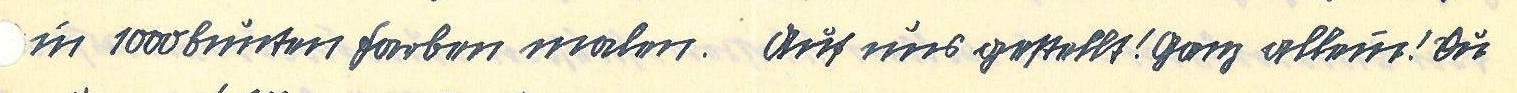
in 1000 bunten Farben malen. Auf uns gestellt! Ganz allein! Du
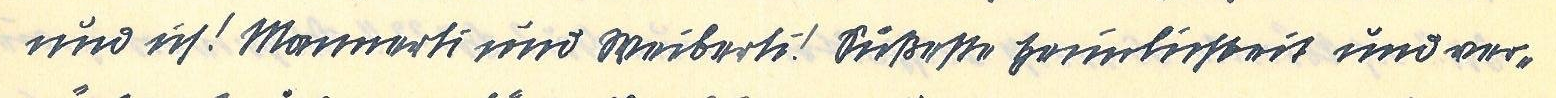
und ich! Mannerli und Weiberli! Süßeste Heimlichkeit und ver¬
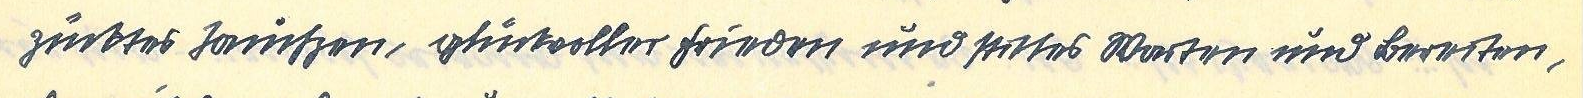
zücktes Jauchzen, glückvoller Frieden und stilles Warten und Bereiten,
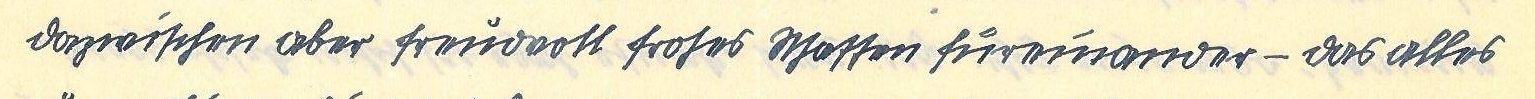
dazwischen aber freudvoll frohes Schaffen füreinander – das alles
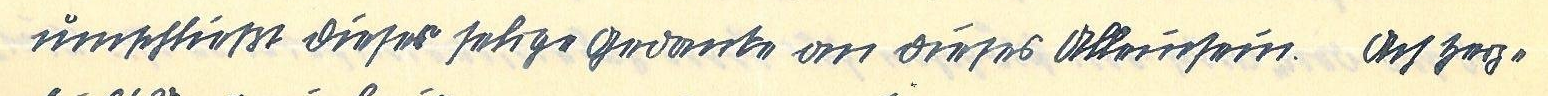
umschließt dieser selige Gedanke an dieses Alleinsein. Ach Her¬
